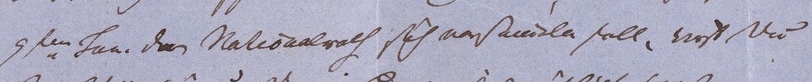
9ten Jun. der Nationalrath sich versammeln soll, wirst Du
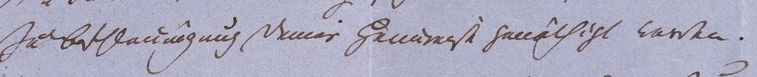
zu Beschleunigung Deiner Heimreise genöthigt werden.
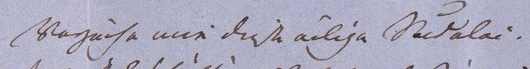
Verzeihe mir diese eilige Sudelei.
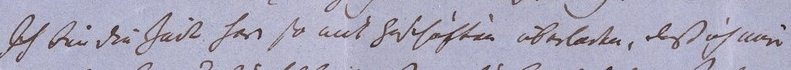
Ich bin die Zeit her so mit Geschäften überladen, daß ich mir
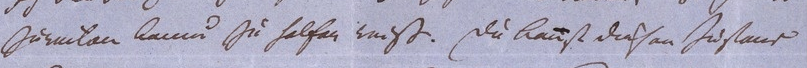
zuweilen kaum zu helfen weiß. Du kennst diesen Zustand
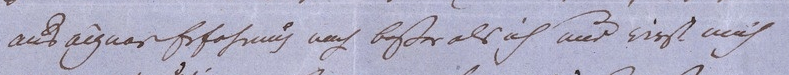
aus eigener Erfahrung noch beßer als ich und wirst mich
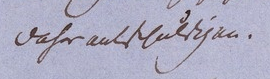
daher entschuldigen.
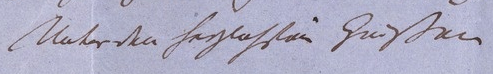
Unter den herzlichsten Grüßen
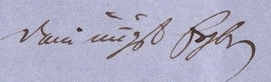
Dein innigst Ergebener
